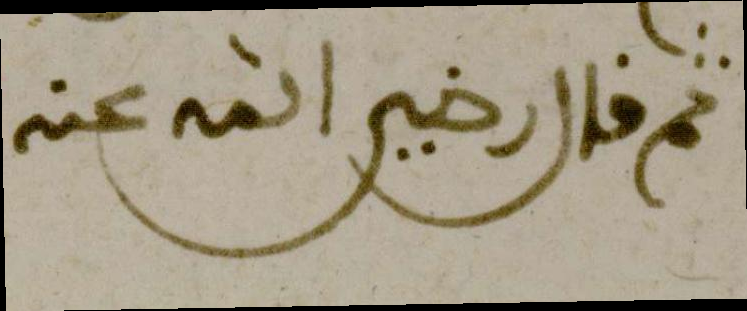ثم قال رضي الله عنه
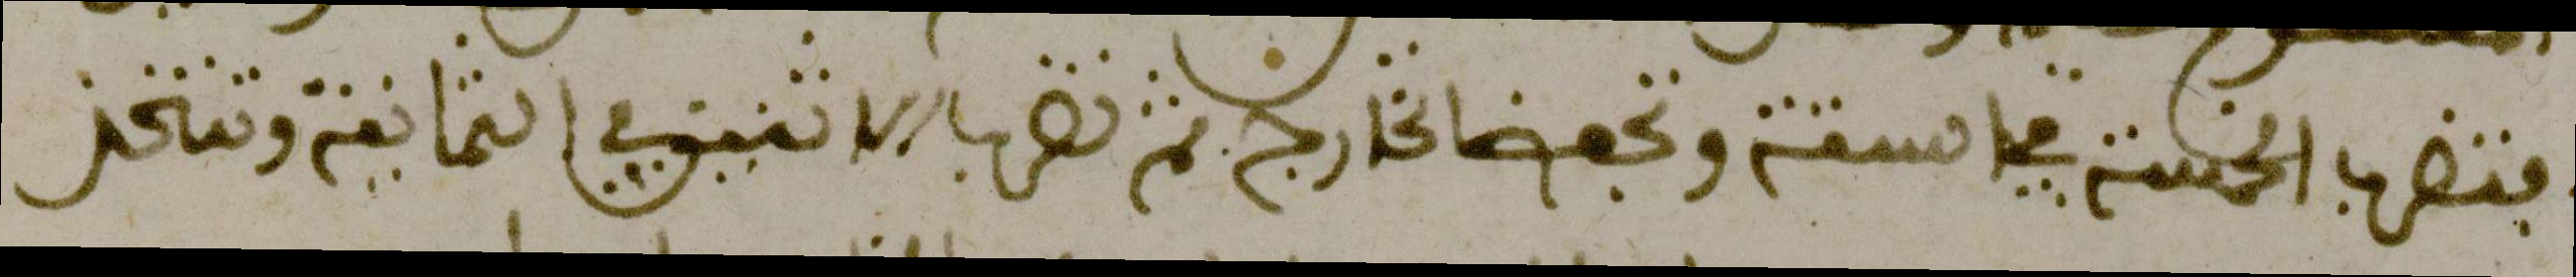فتضرب الخمسة في ستة و تحفض الخارج ثم تضرب الاثنين في الثمانية و تتخذ
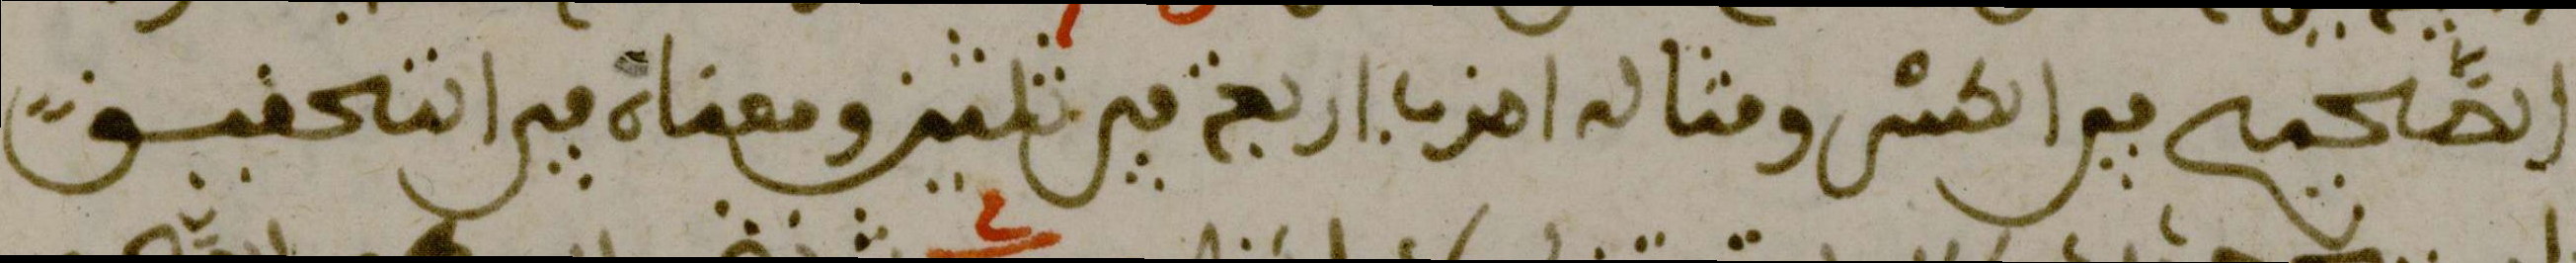الصّحيح في الكسر و مثاله اضرب اربعة في ثلثين و معناه في التحقيق
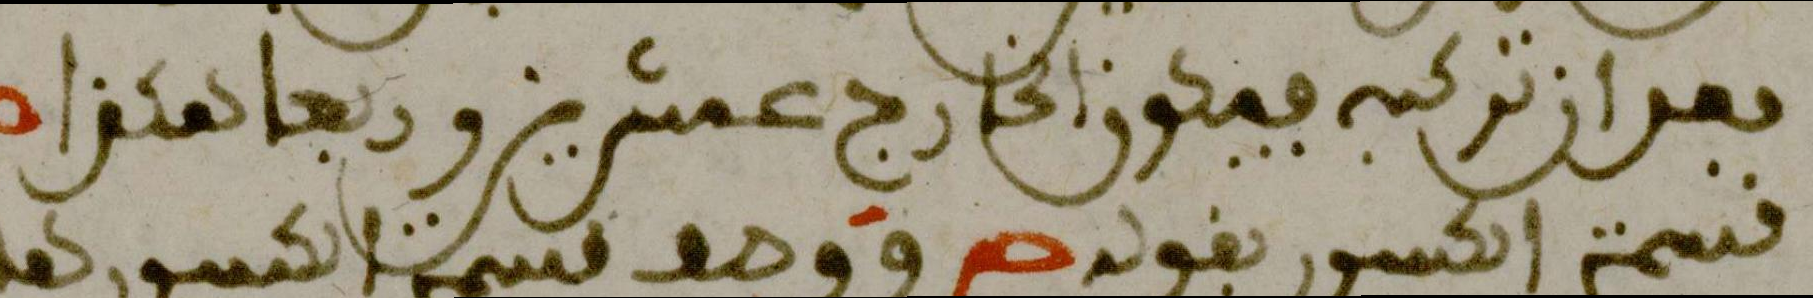بعد ان تركبه فيكون الخارج عشرين و ربعا هكذا
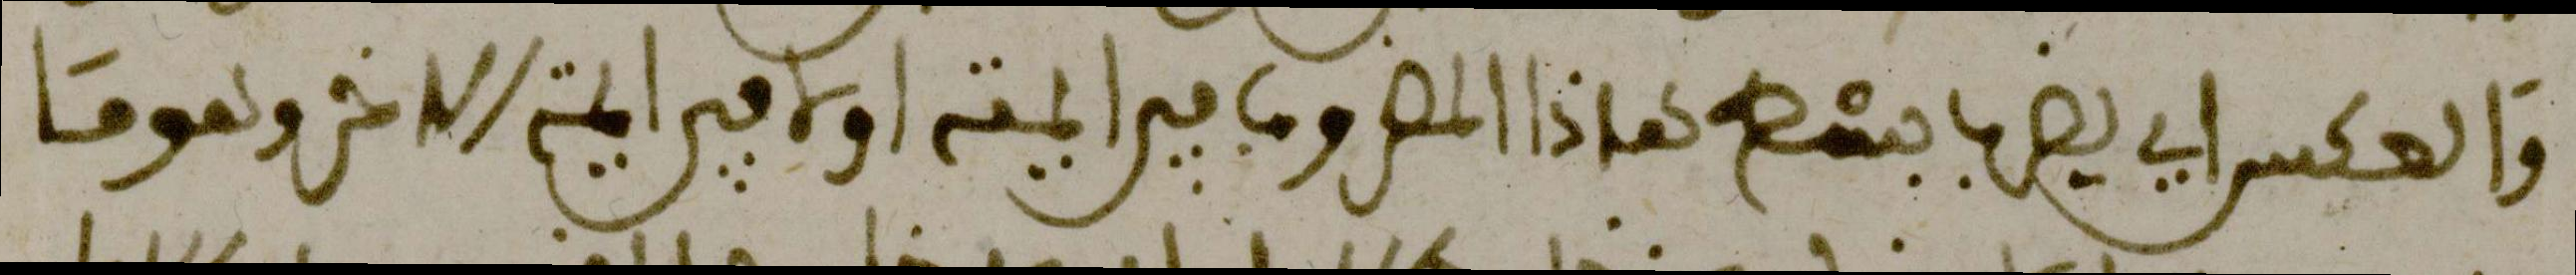و العكس اي يضرب بسط هاذا المضروب في ايمته اولا في ايمة الاخر و هو ما
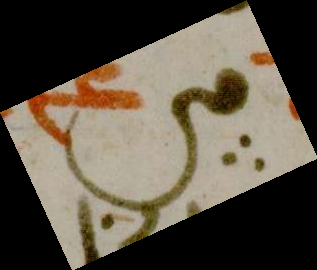في
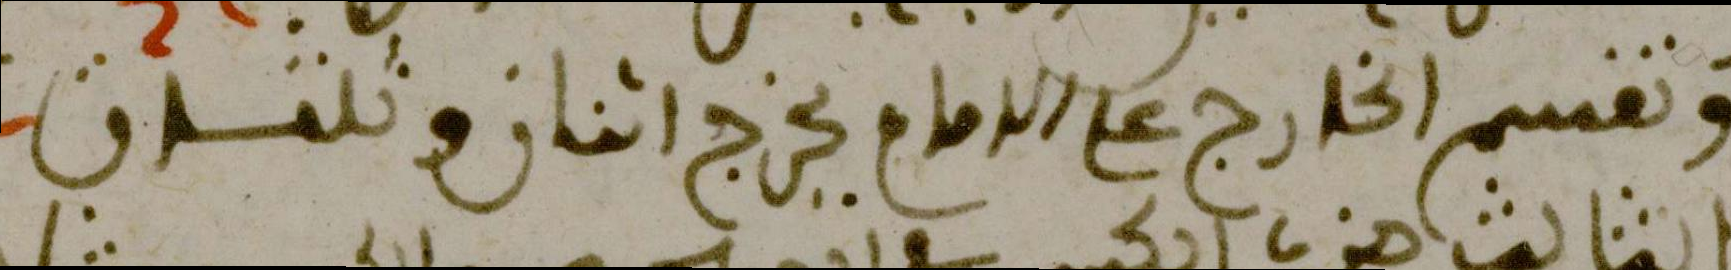و تقسم الخارج على الامام يخرج اثنان و ثلثان
